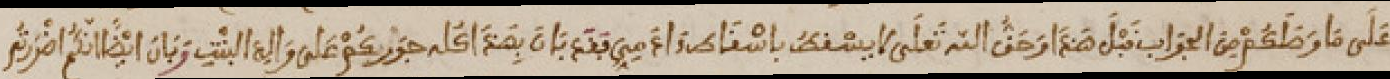على ما وصلكم من الجواب قبل هذا و حق الله تعلى لا يسقط باسقاط ءادمي فقد بان بهذا كله جوركم على والد البنت و بان ايضا انكم اضررتم
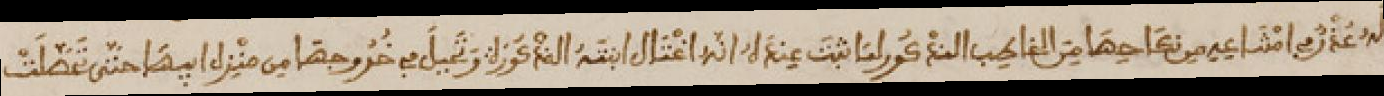له عذر في امتناعه من نكاحها من الخاطب المذكور لما ثبت عنده انه اغتال ابنته المذكورة وتحيل في خروجها من منزل ابيها حتى تحصلت
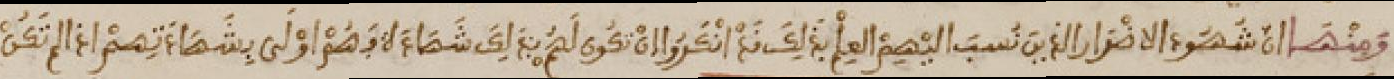ومنها ان شهود الاضرار الذين نسب اليهم العلم بذلك قد انكروا ان تكون لهم بذلك شهادة فهم اولى بشهادتهم اذا لم تكن
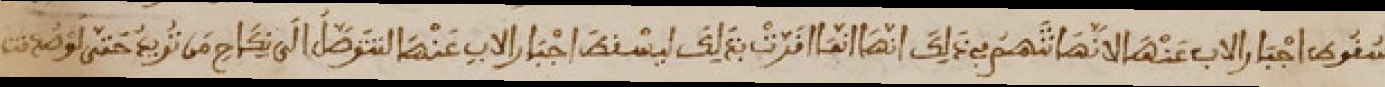سقوط اجبار الاب عنها لانها تتهم في ذلك انها انما اقرت بذلك ليسقط اجبار الاب عنها لتتوصل الى نكاح من تريد حتى لو صدقت
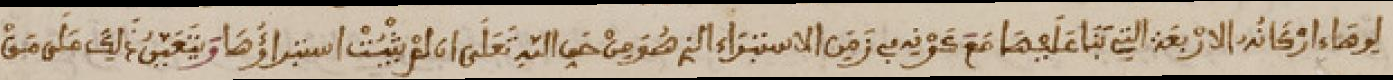لوهاء اركانه الاربعة التي بنا عليها مع كونه في زمن الاستبراء الذي هو من حق الله تعلى ان لم يثبت استبراؤها ويتعين ذلك على من
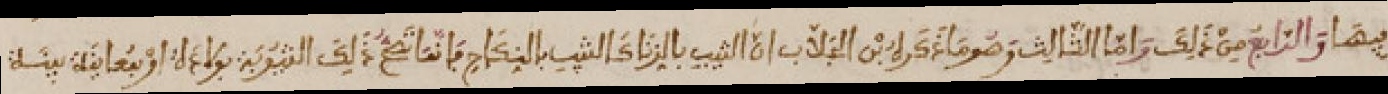فيها و الرابع من ذلك واما الثالث وهو ما ذكره ابن الجلاب ان الثيب بالزنا كالثيب بالنكاح فانما تصح ذلك الثيوبة بولادة او بمعاينة بينة
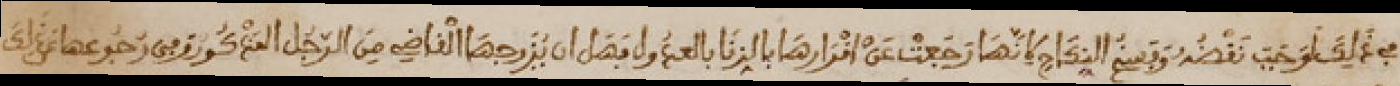في ذلك لوجب نقضه أيضا وفسخ النكاح لانها رجعت عن اقرارها بالزنا بالعدول فهل ان يزوجها القاضي من الرجل المذكور وفي رجوعها عن ذلك
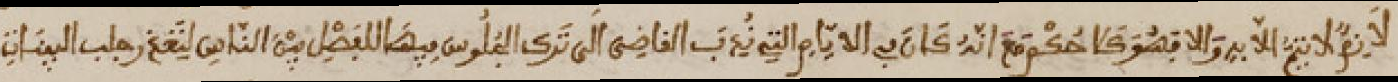لازم لا يتم إلا به والا فهو كلا حكم مع انه كان في الايام التي ندب القاضي الى ترك الجلوس فيها للفصل بين الناس لتعذر جلب البينات
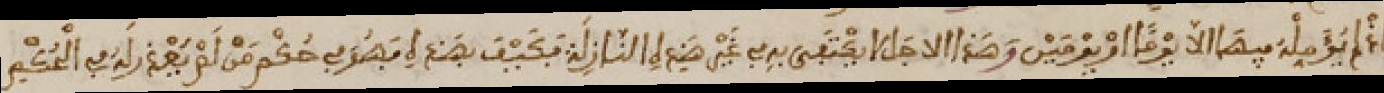اذ لم يؤجله فيها إلا يوما او يومين وهذا الاجل لا يكتفى به في غير هذه النازلة فكيف بهذه فهو في حكم من لم يعذر له في الحكم
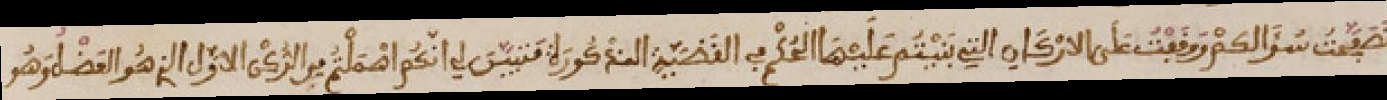تصفحت سؤالكم ووقفت عل الاركان التي بنيتم عليها الحكم في القضية المذكورة فتبين لي انكم اهملتم في الركن الاول الذي هو العضل وهو
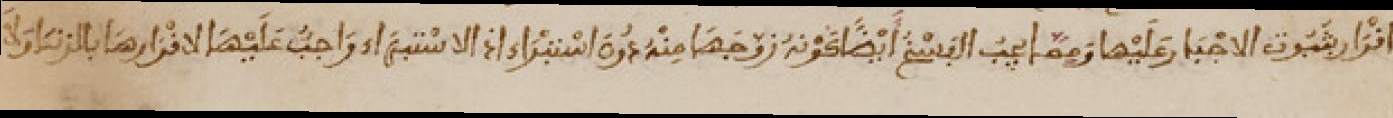اقرار بثبوت الاجبار عليها ومما يجب الفسخ ايضا كونه زوجها منه دون استبراء اذ الاستبراء واجب عليها لاقرارها بالزنا ولا
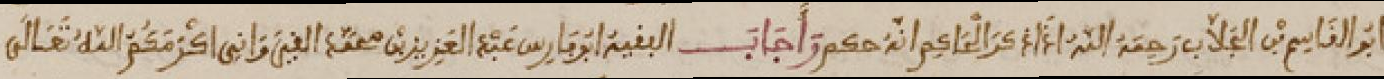ابو القاسم بن الجلاب رحمه الله اذا ذكر الحاكم انه حكم و أجاب الفقيه ابو فارس عبد العزيز بن محمد القيرواني اكرمكم الله تعالى
